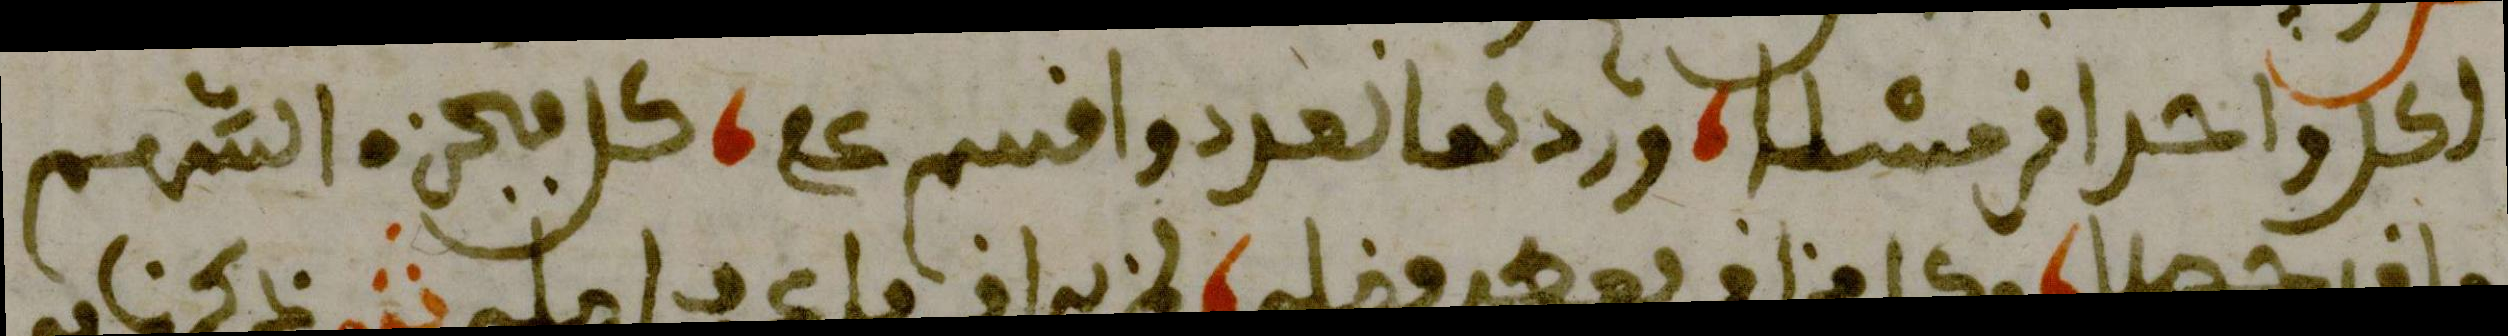لكل واحد اقر مسْلا وردها لعدد واقسم على كل فجزء السَّهم
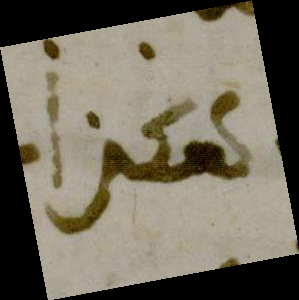هكذا
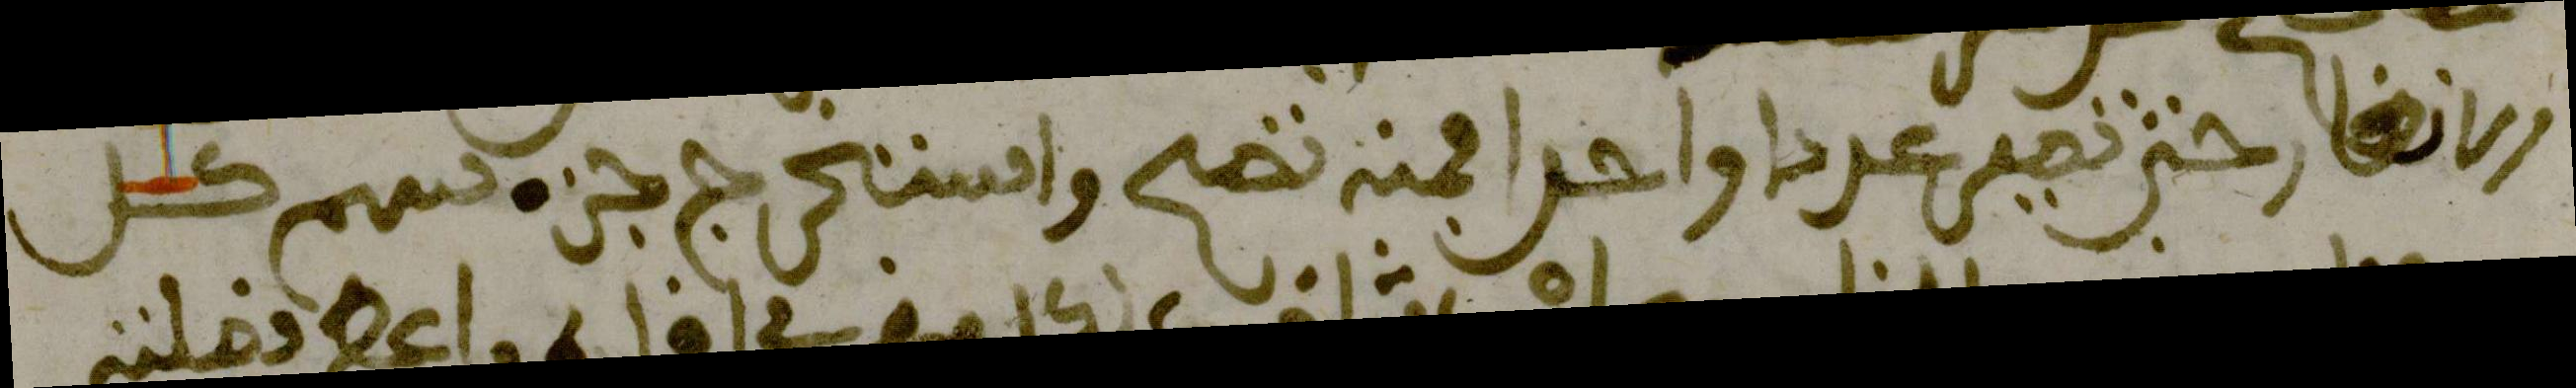الانظار حتى نصير عددا واحدا فمنه تصح واستخرج جزء سهم كل
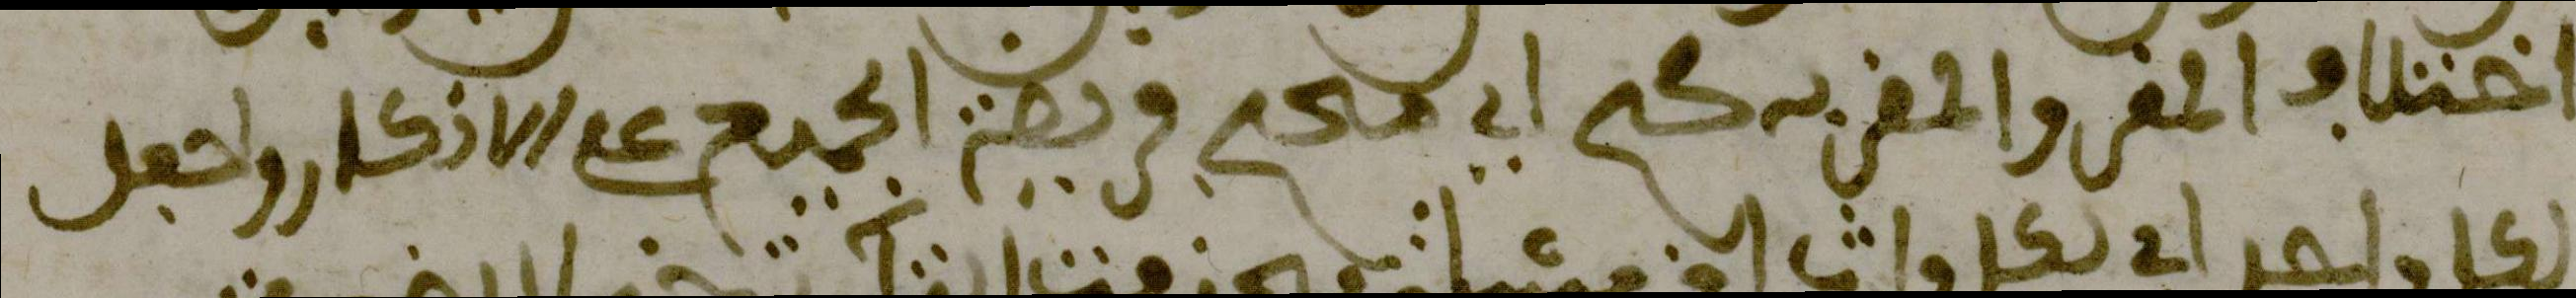اختلاف المقر والمقر به صحح اي صحح فريضة الجميع على الانكار واجعل
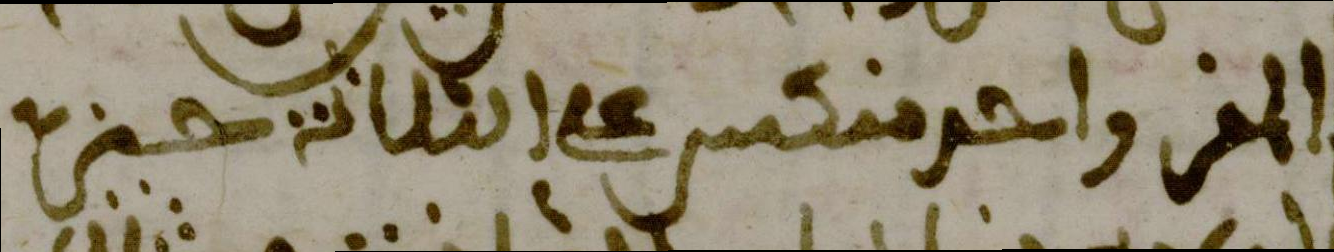المقر واحد منكسر على الثلاثة حين
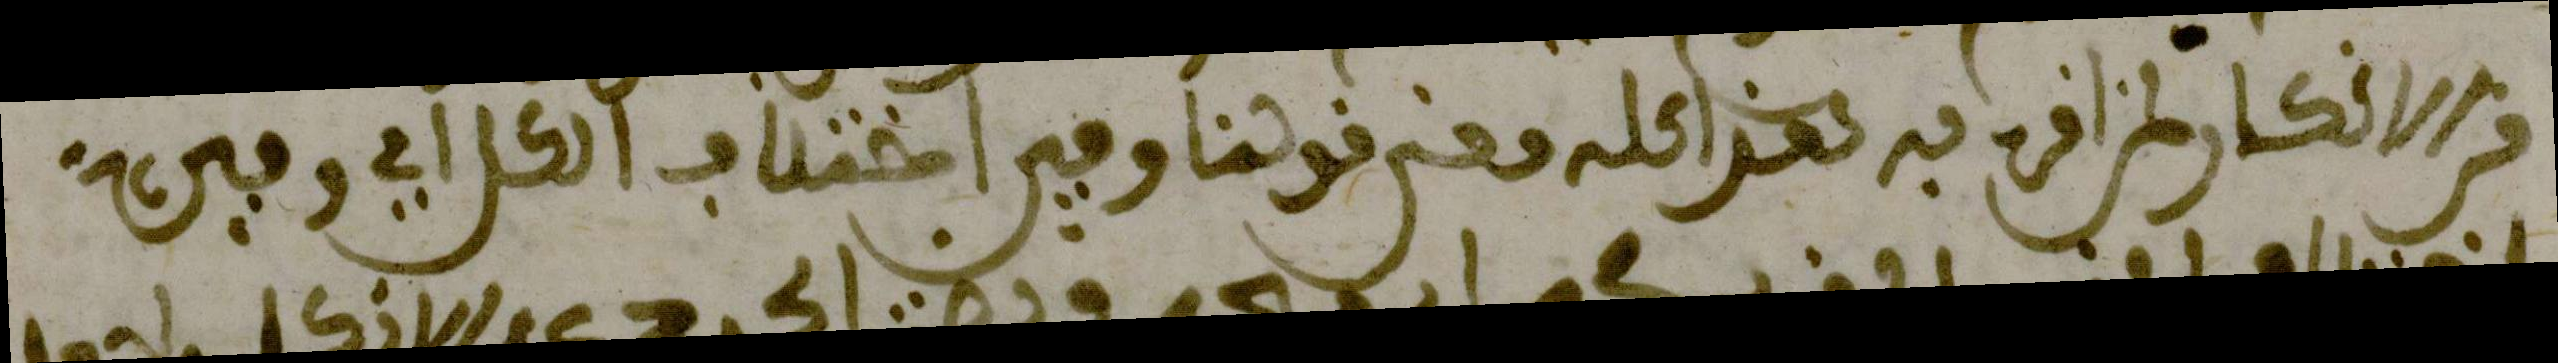من الانكار لمن اقر به هذا كله معنى قولنا ووفي اختلاف الكل اي وفي
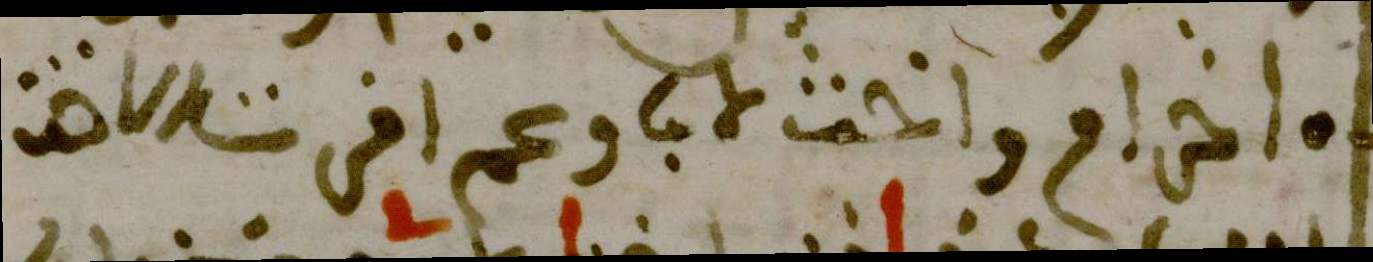ءاخر ام واخت لاب وعم اقرت الاخت
